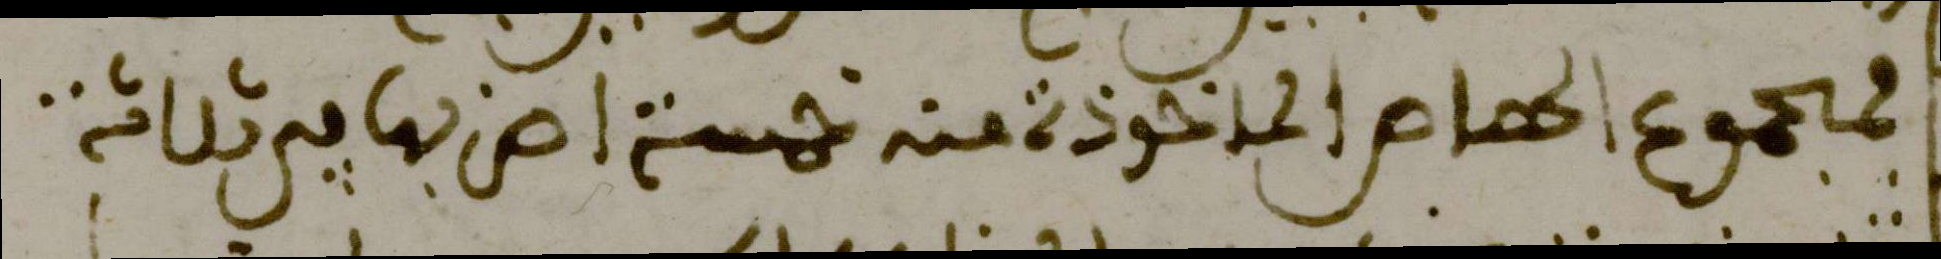مجموع الحصاص الماخوذة منه خمسة اضربها في ثلاثة
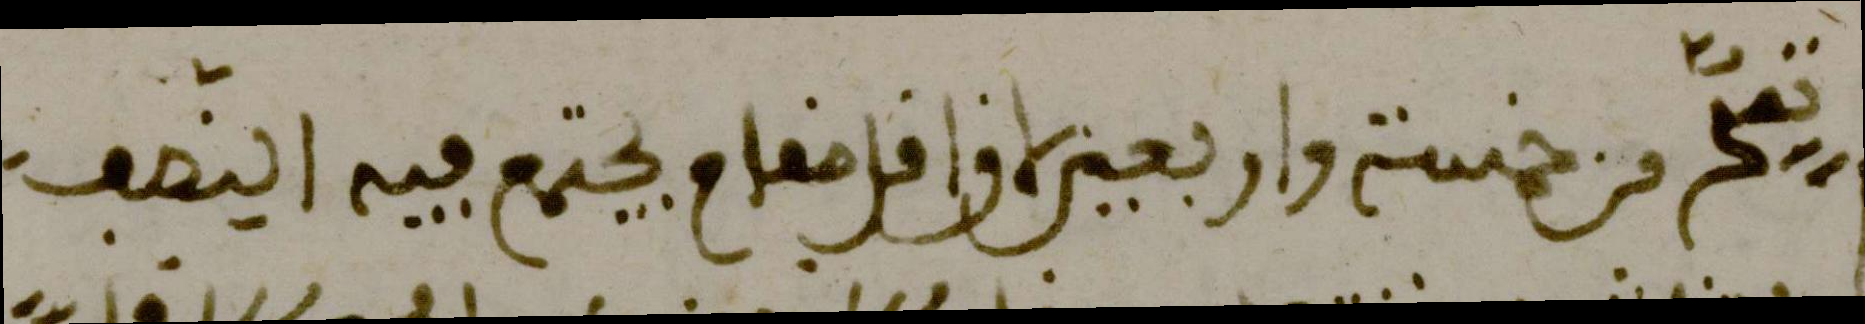تصح من خمسة واربعين لان اقل مقام يجتمع فيه النصف
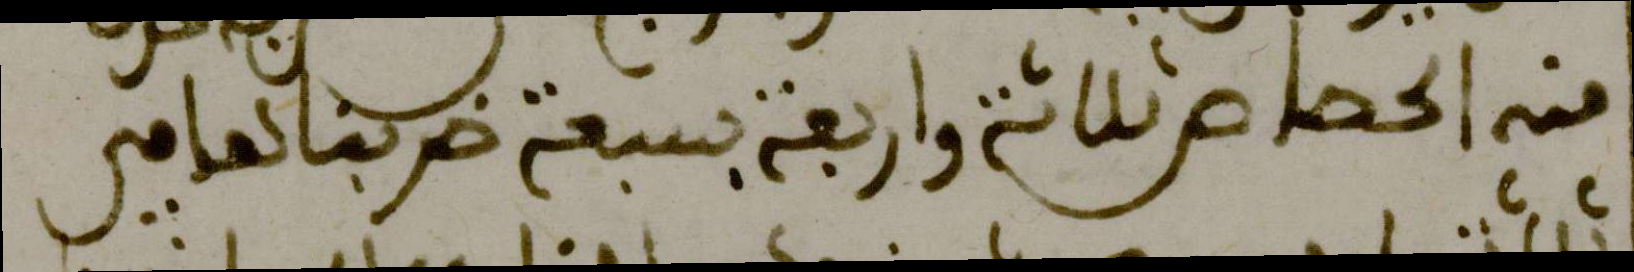منه الحصاص ثلاثة واربعة بسبعة ضربناها في
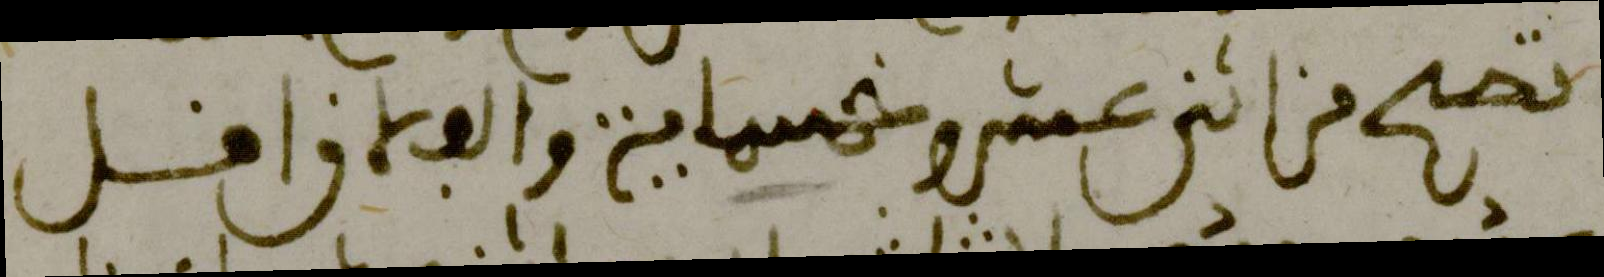تصح من اثنى عشر رخمسماية والف لان اقل
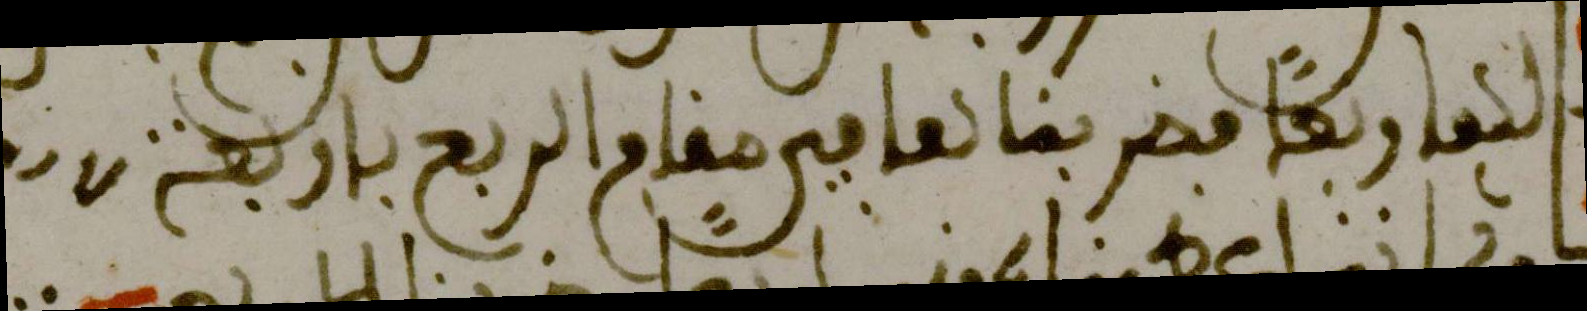لها ربعا فضربناها في مقام الربع باربعة
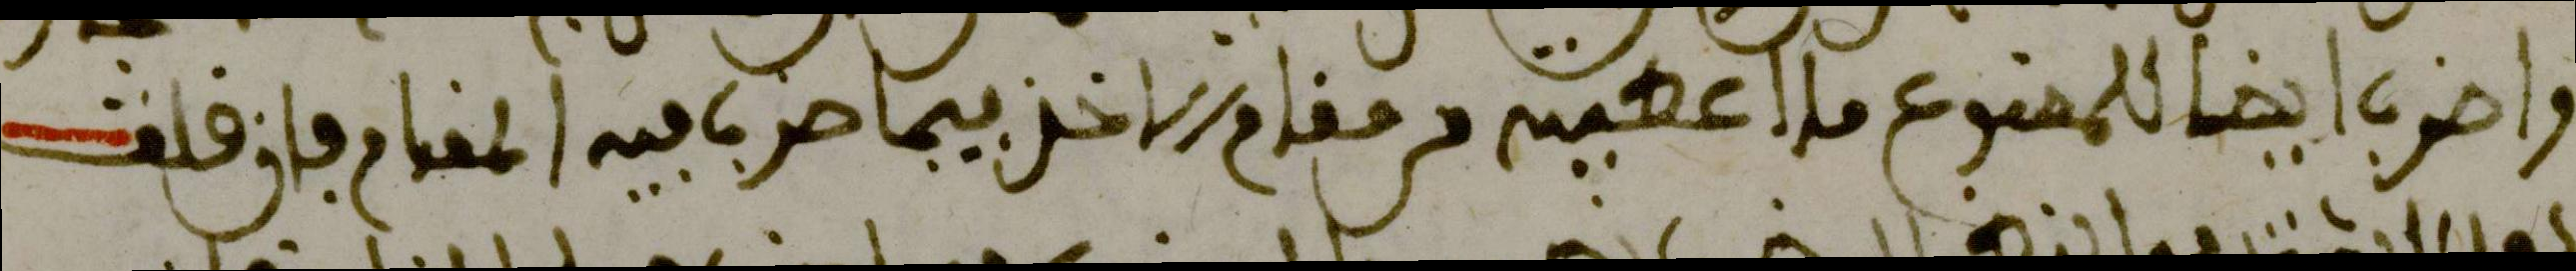واضرب ايضا للممنوع ما اعطيته من مقام الاخذ فيما ضرب فيه المقام فان قلت
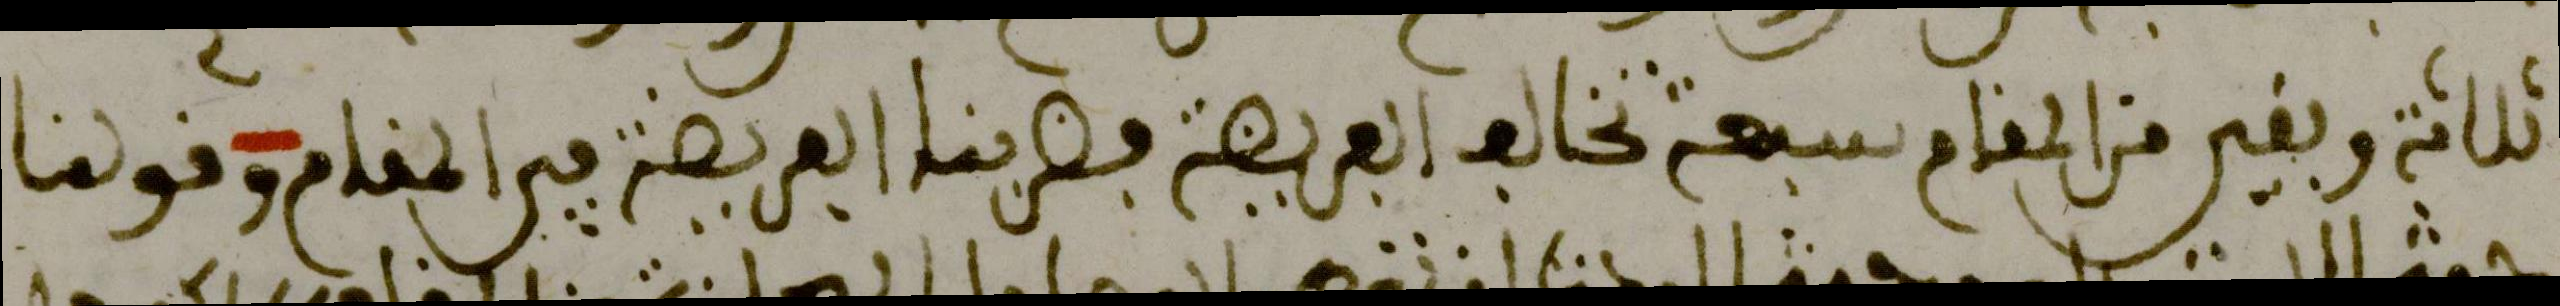ثلاثة وبقي من المقام سبعة تخالف الفريضة فضربنا الفريضة في المقام وقولنا
